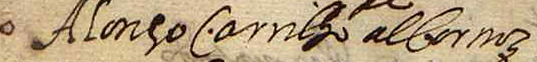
Alonso Carrilho de albernoz
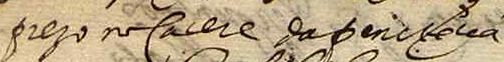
prezo no Cacere da penitēcia
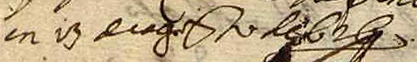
en i3 de agosto de 626
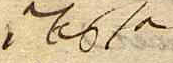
1a testa
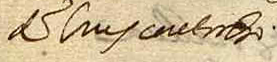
dō luis coutinho.
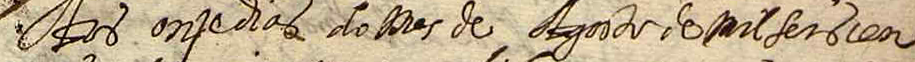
Aos onze dias do mes de Agosto de mil seiscen
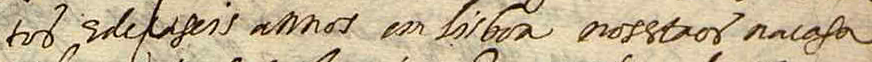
tos E dezaseis annos em lisboa nos estaos na casa
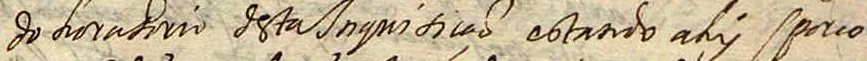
do horatorio desta Inquisiçaõ estando ahy (por co
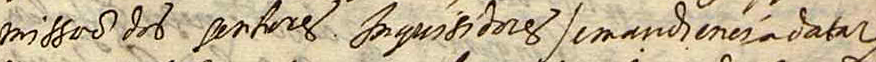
missaõ dos senhores Jnquisidores) em audiencia da tar
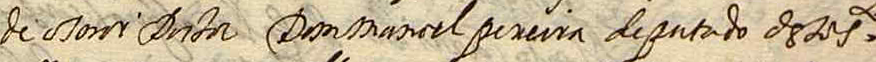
de o sonr̄ Doctor Dom manoel pereira deputado deste sto.
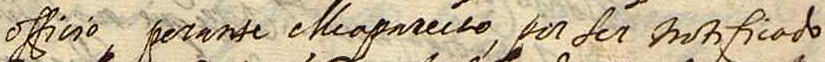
officio, perante elle apareceo, por ser notificado
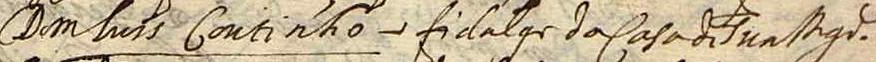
Dom luis Coutinho - fidalgo da Casa de sua Mgd.e
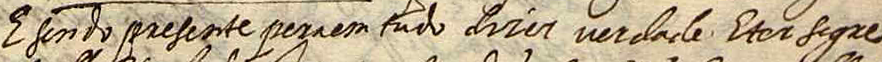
E sendo presente pera em tudo dizer uerdade E ter segre
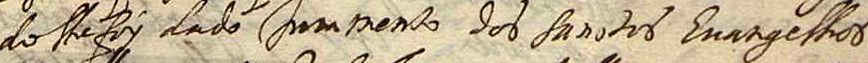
do lhe foy dado Juramento dos sanctos Euangelhos
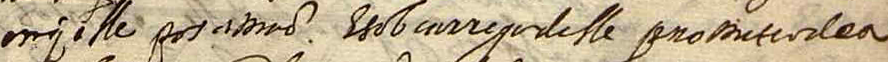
em q̄ elle pos a maõ E sob carrego delle prometeo de a
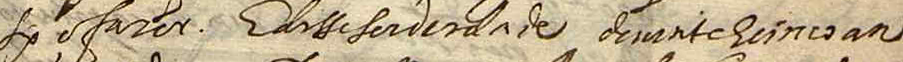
sy o fazer. E disse ser de idade de uinte E cinco an
